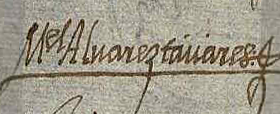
Mel Aluarez tauares
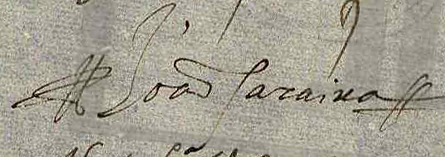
Joaõ Saraiua
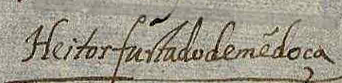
Heitor furtado de mēdoça
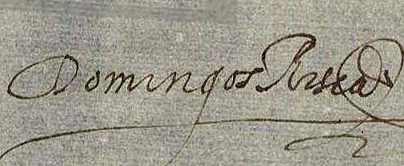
Domingos Riscado
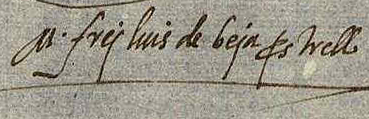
M. frej luis de beja ꝓstrello
